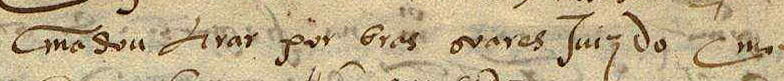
mādou tirar por bras soares Juiz do crime
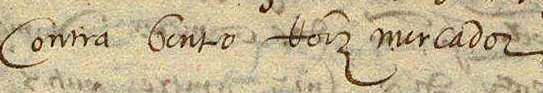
Contra bento Rōiz mercador
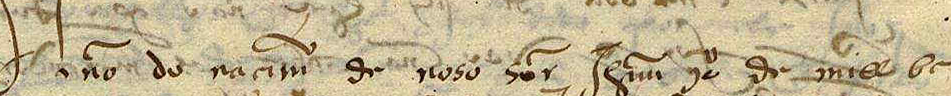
An̄o do naçimto de noso sōr Jhu̅u xo de mill bc
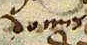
do mes
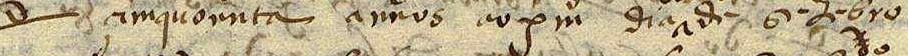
e cimquoenta ann̄os ao prmo dia de setēbro
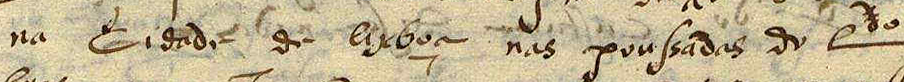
na Cidade de lixboa nas poussadas do ldo
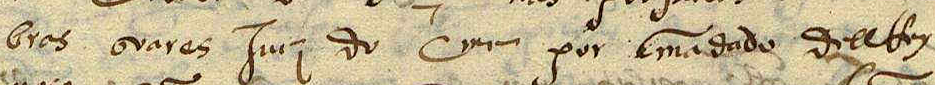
bras soares Juiz do Cme por m̄adado dell Rey
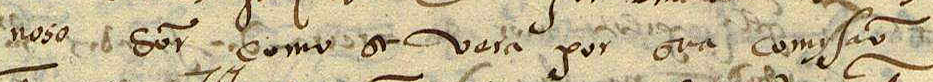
noso so̅r como se vera por sua comisaō
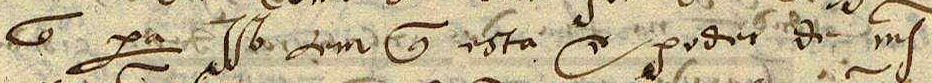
q̄ ꝑa Iso tem q̄ esta e̅ poder de mj̄
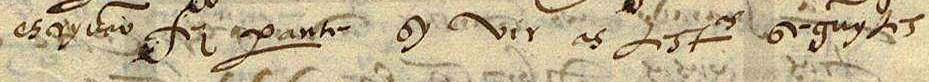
escryuão fez ꝑante sy vir as testas seguȳtes
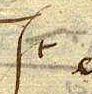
Jt
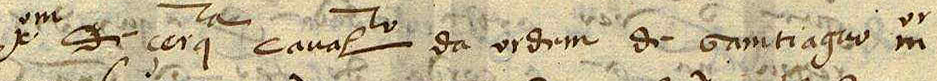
Jom de cerqra caualro da ordem de samtiaguo mor
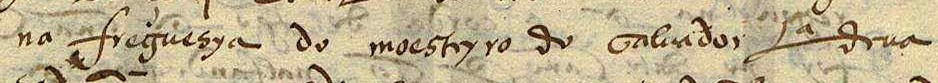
na freguesya do moesteyro do saluador ta deua
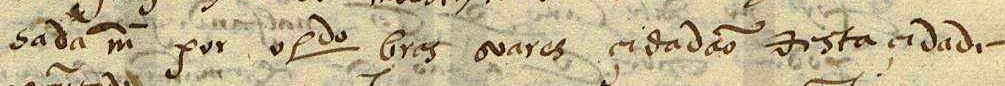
sadamte por o Ldo bras soares cidadão desta çidade
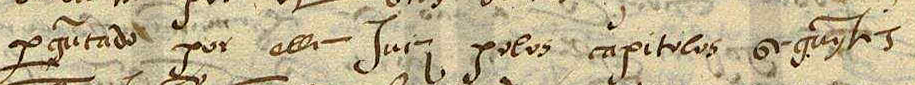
ꝑḡutado por elle Juiz polos capitolos segūytes
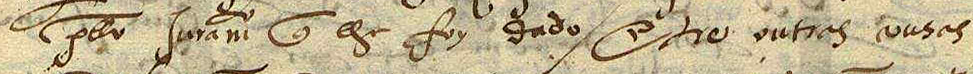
p̄llo Juramto q̄ lhe foy dado / e̅tre outras cousas
